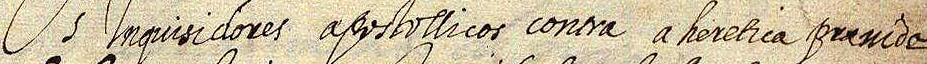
Os Inquisidores apostollicos contra a heretica prauida
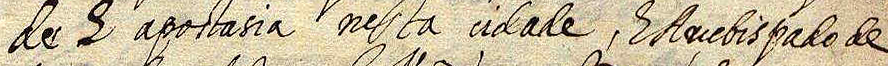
de E apostasia nesta cidade, E Arcebispado de
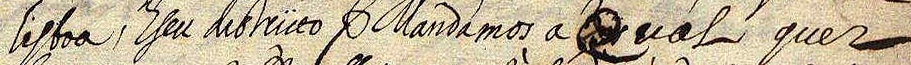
lisboa, E seu destricto & Mandamos a QuaLquer
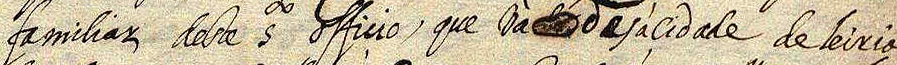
familiar deste sto officio, que và _ desa cidade de leiria
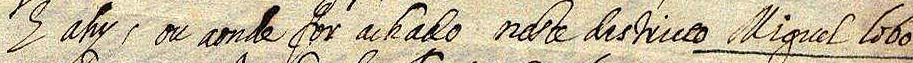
E ahy, ou aonde for achado neste destricto Miguel lobo
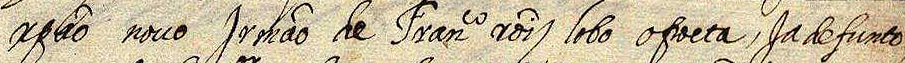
xpaõ nouo Jrmão de Franco rōiz lobo o poeta, Ja defunto,
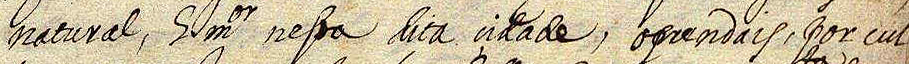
natural, E mor nessa dita cidade, o prendais, por cul
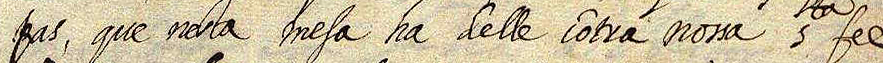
pas, que nesta mesa ha delle cōtra nossa sta fee
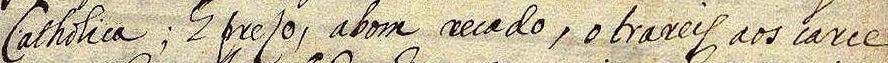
Catholica; E prezo, a bom recado, o trareis aos carçe
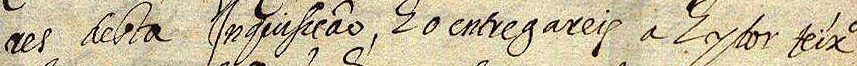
res desta Jnquisição, E o entregareis a Eytor teixa
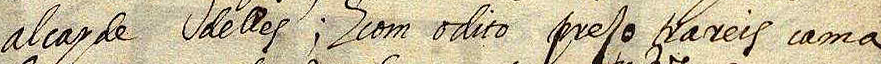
alcayde delles; E com o dito prezo trareis cama
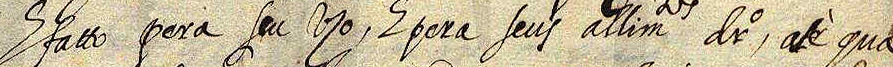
E fatto pera seu vzo, E pera seus allimtos dro, atè qua
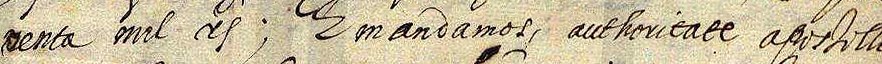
renta mil rs̄; E mandamos, authoritate apostolli
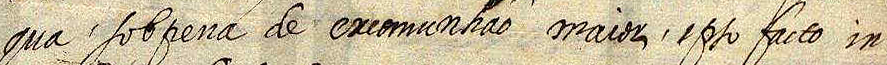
qua sob pena de excomunhão maior, ipso facto in
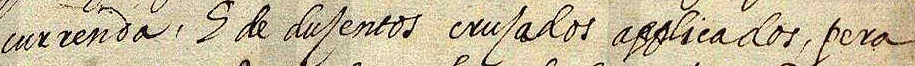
currenda, E de duzentos cruzados applicados, pera
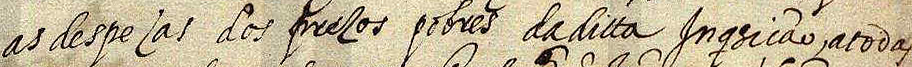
as despezas dos prezos pobres da ditta Jnꝗsição, a todas
